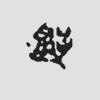𡄹
